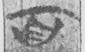百
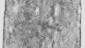廿
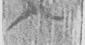八
